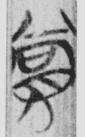賞
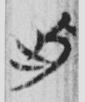此
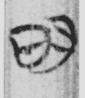明
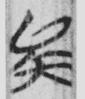矣
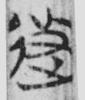﨤（及）
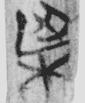桀
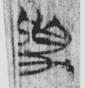受（紂）
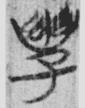{幽子}（幽）
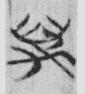萬（厲）
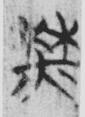焚
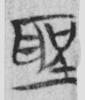聖
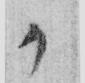人
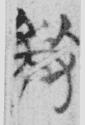殺
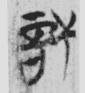訐（諫）
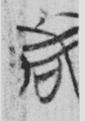者
